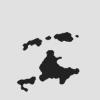五
